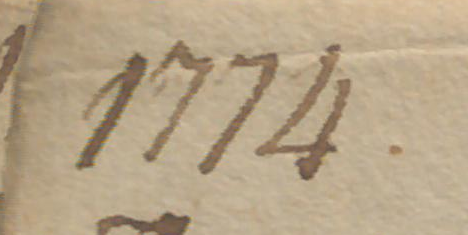1774
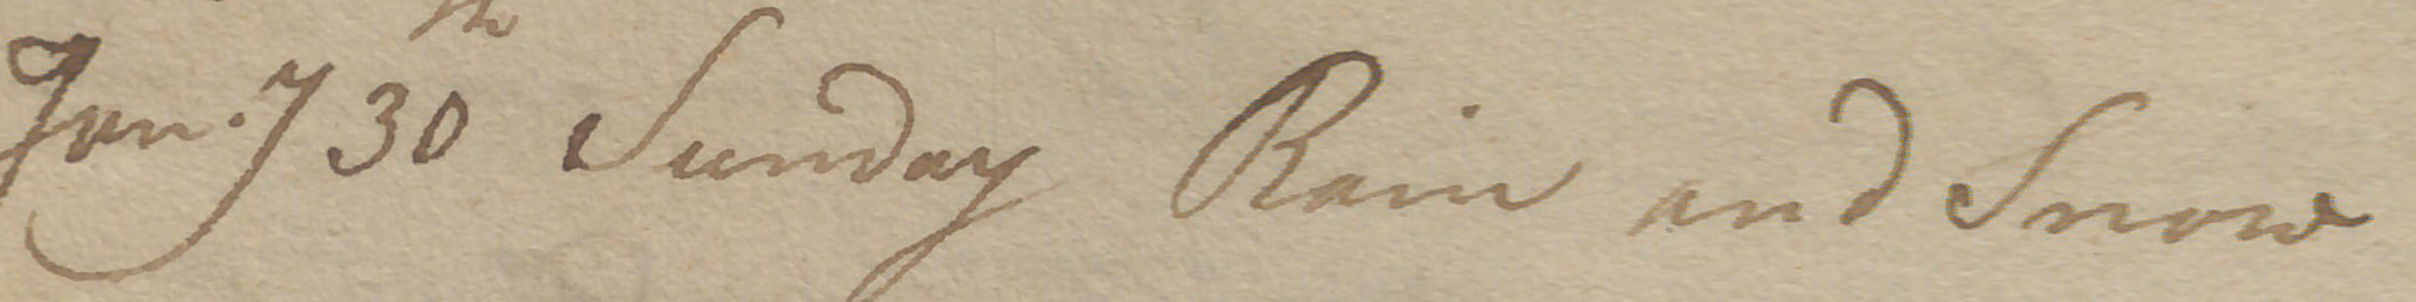Jan^y. 30^th. Sunday Rain and Snow
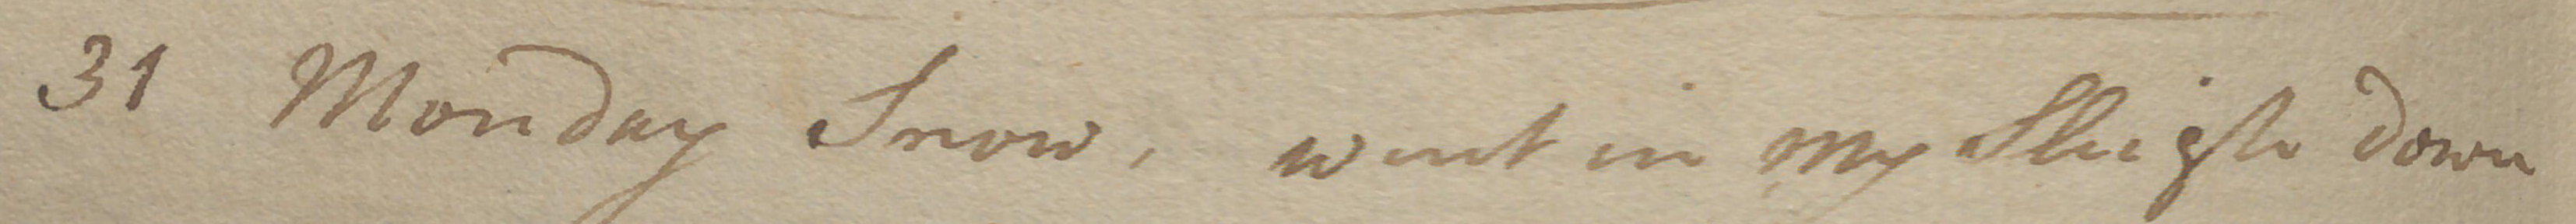31 Monday Snow, went in my Sleigh down
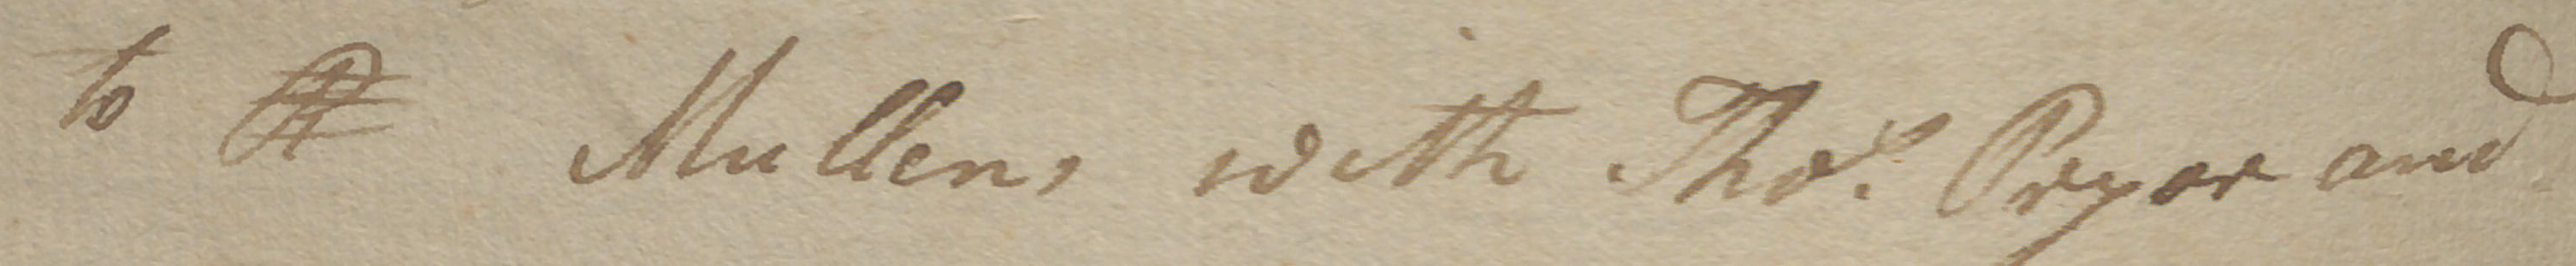to [R] Mullens with Tho^s. Pryor and
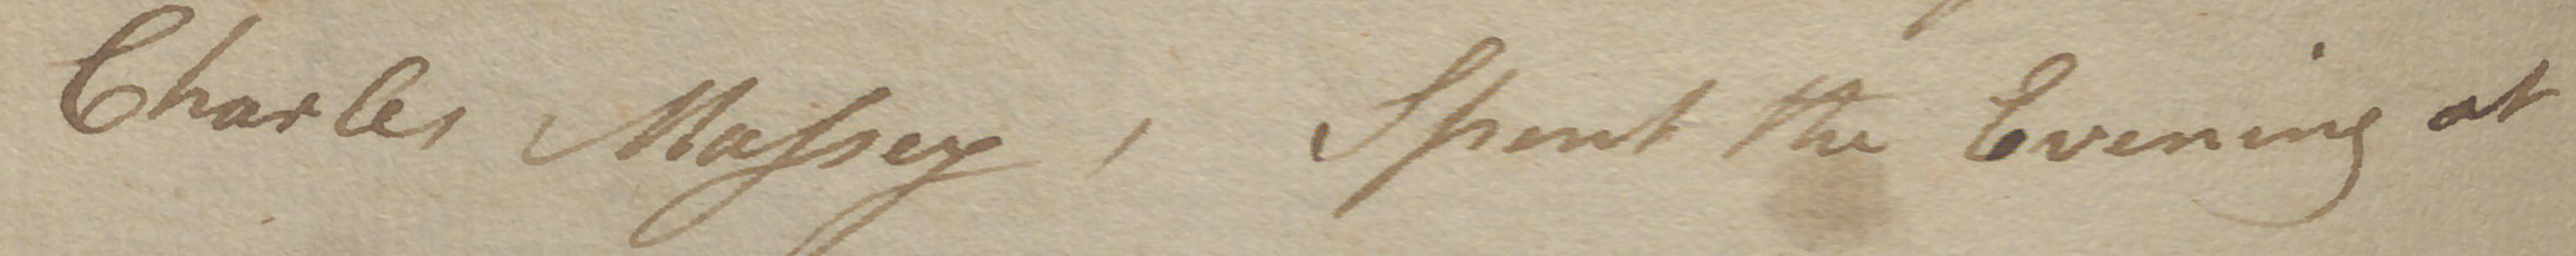Charles Massey, Spent the Evening at
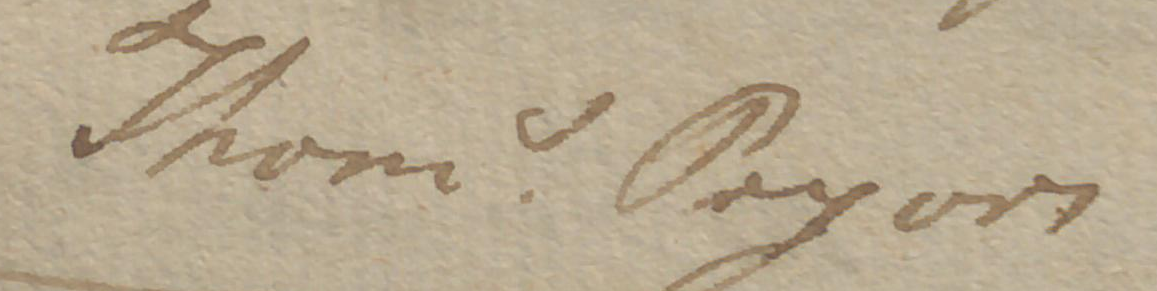Thom^s. Peyors
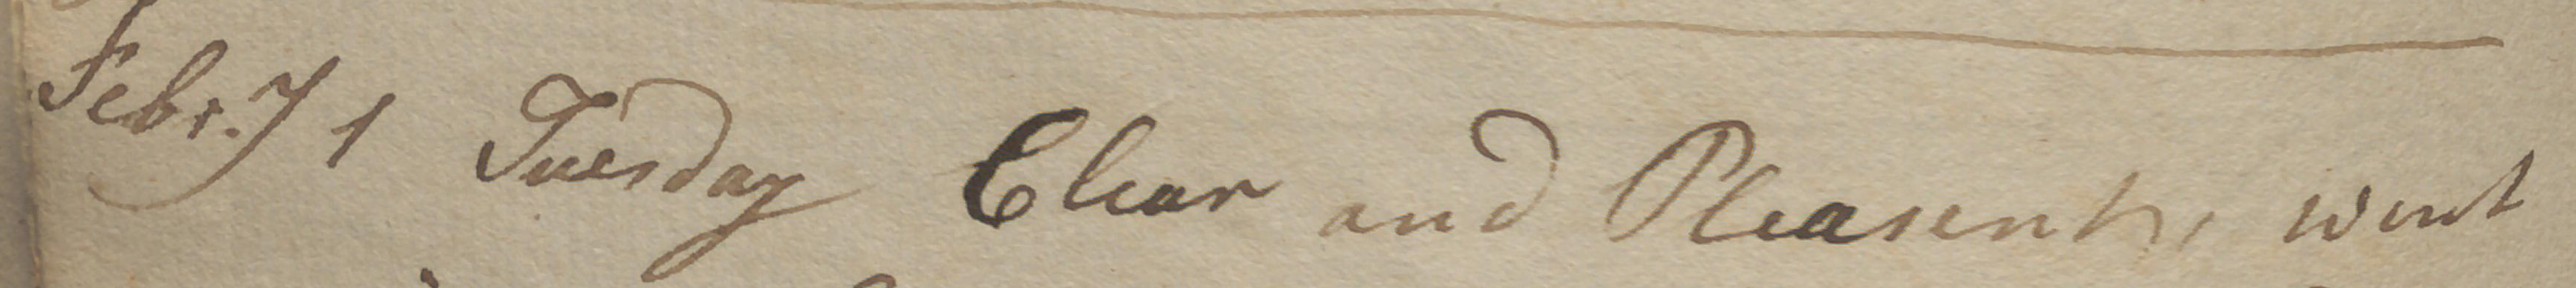Febr^y 1 Tuesday Clear and Pleasent, went
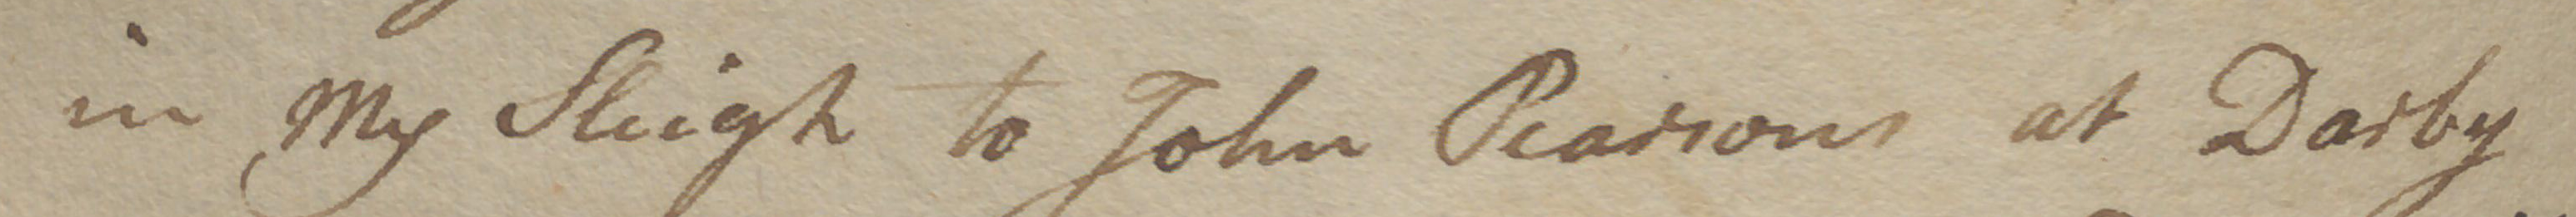in My Sleigh to John Pearsons at Darby
